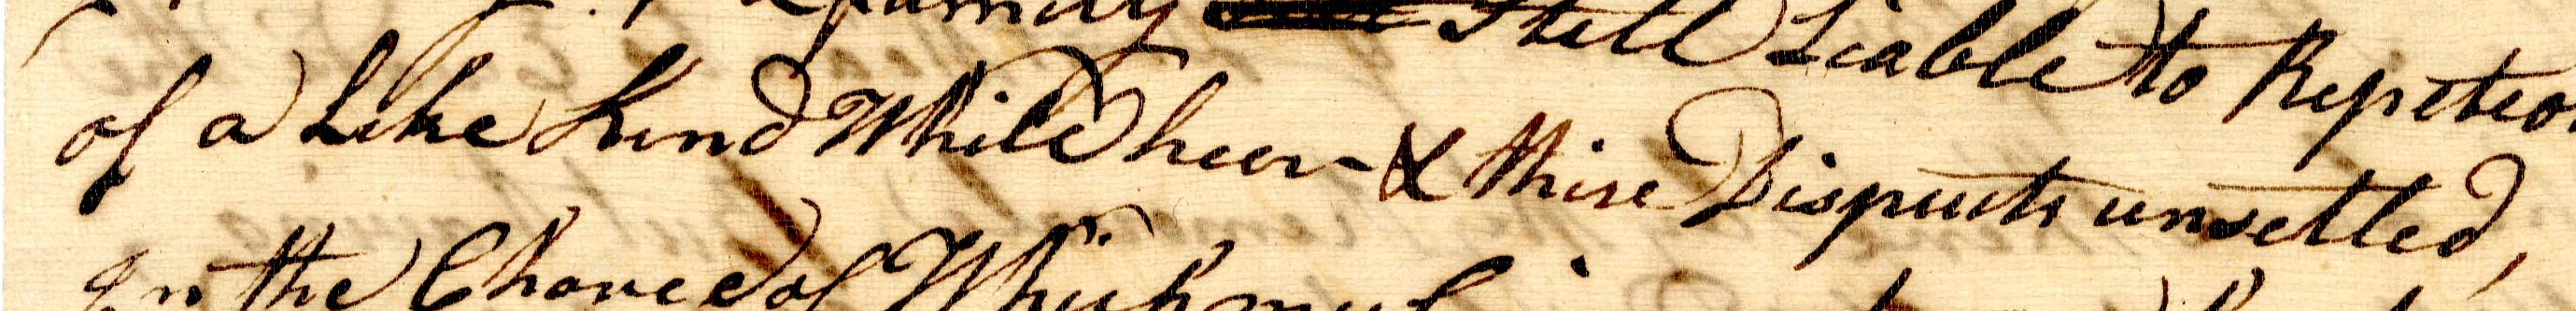of a Like kind while heer & these Dispuits unsetled,
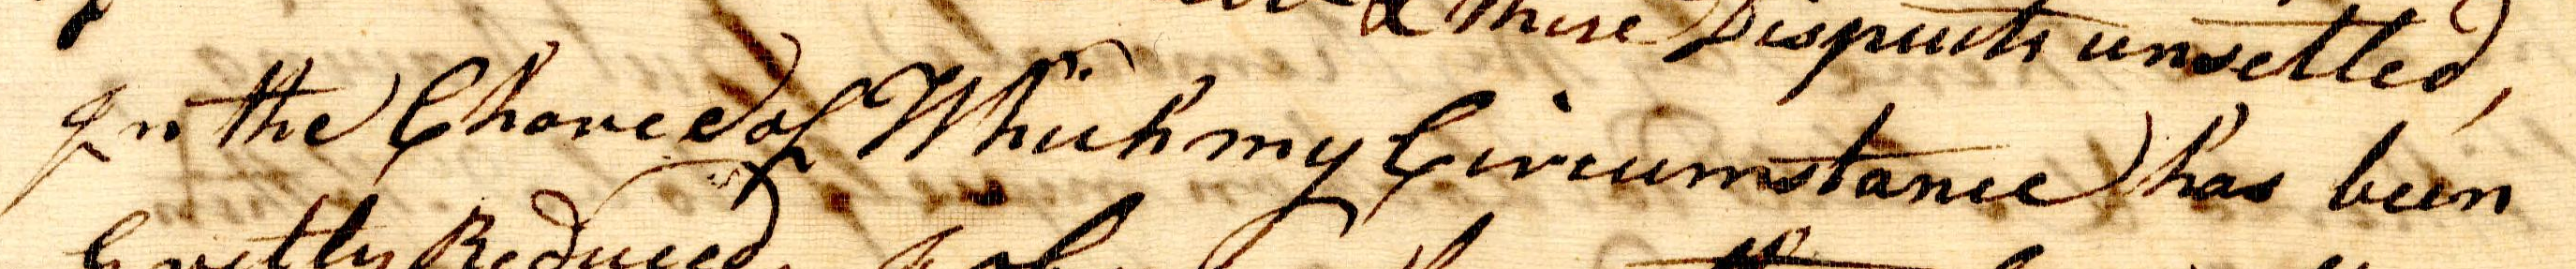In the Chance of Which my Circumstance has been
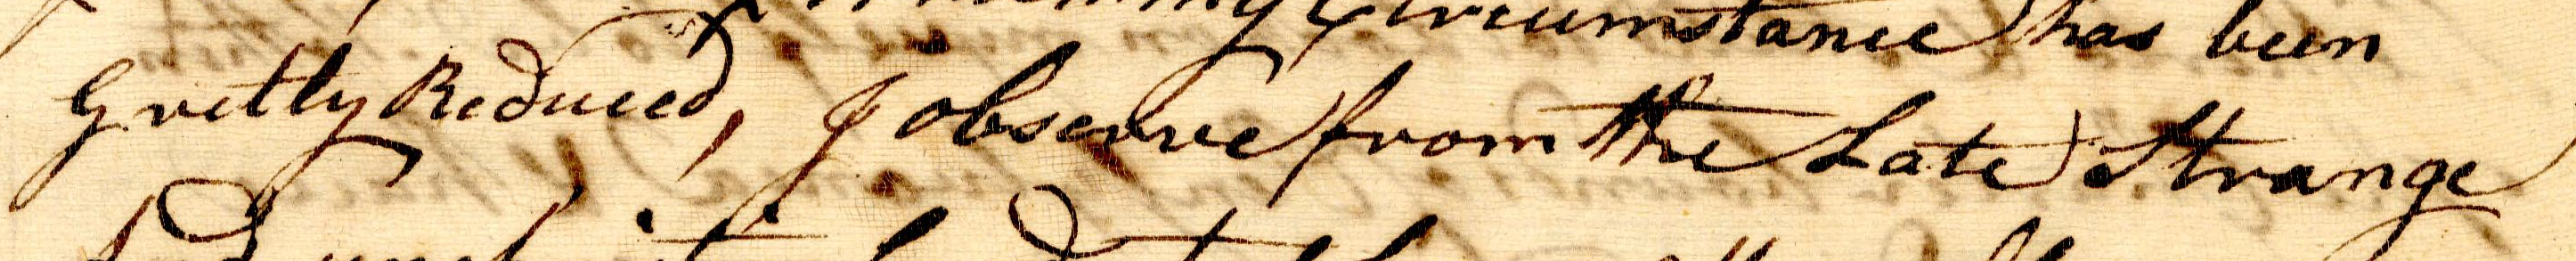Greatly Reduced, I observe from the Late Strange
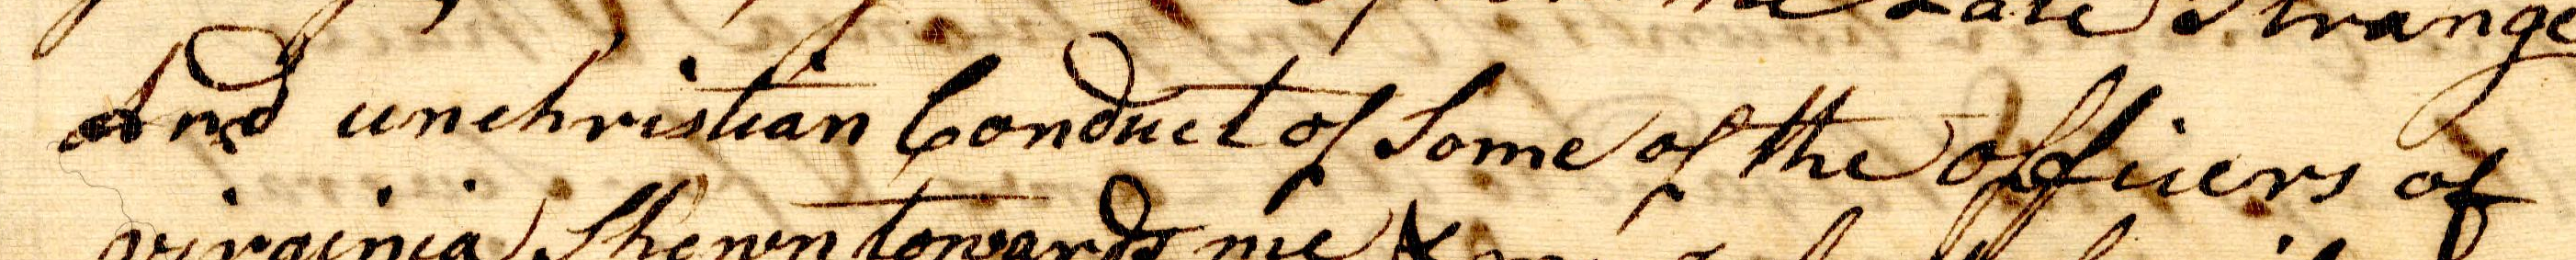and unchristian Conduct of some of the officers of
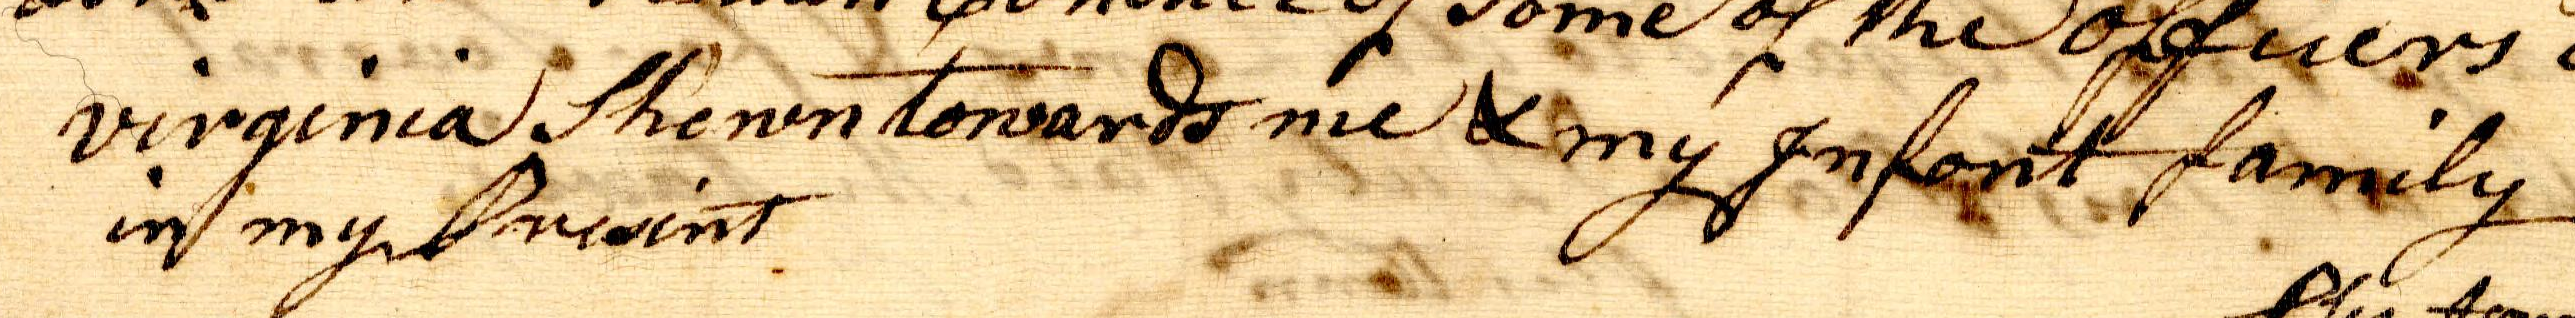virginia Shewn towards me & my Infant family
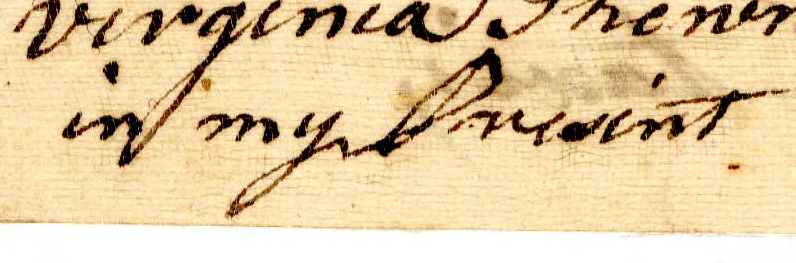in my Present
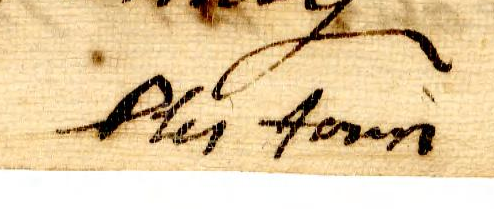Ples town
